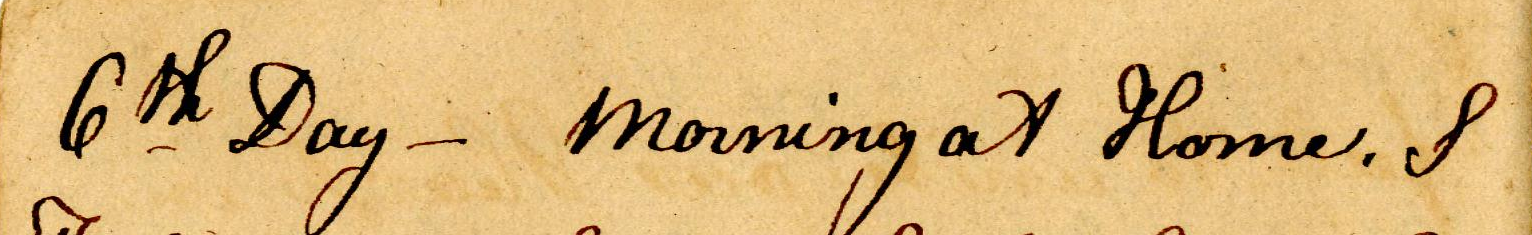6^th Day- Morning at Home, S
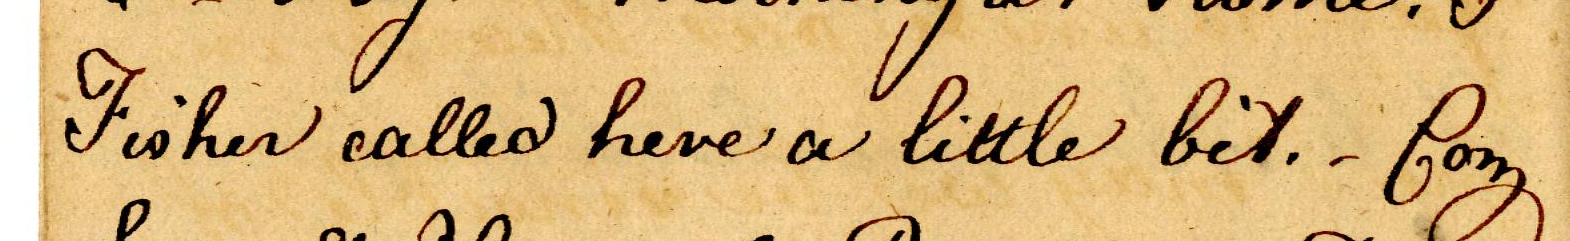Fisher called here a little bit.- Coz
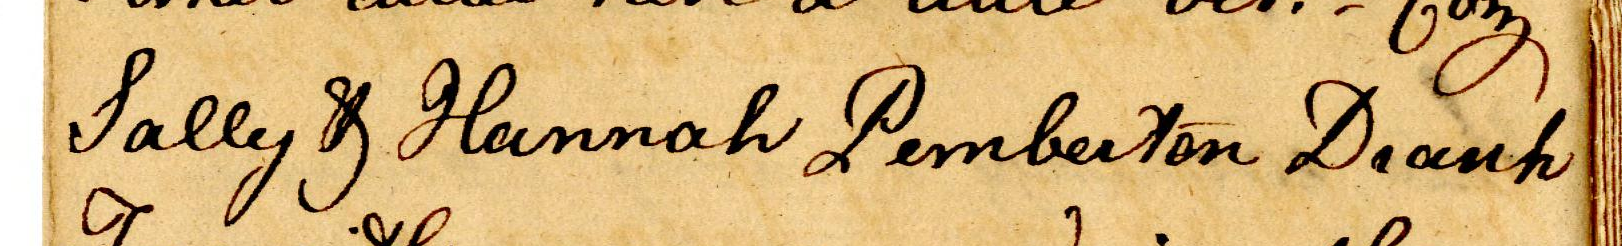Sally & Hannah Pemberton Drank
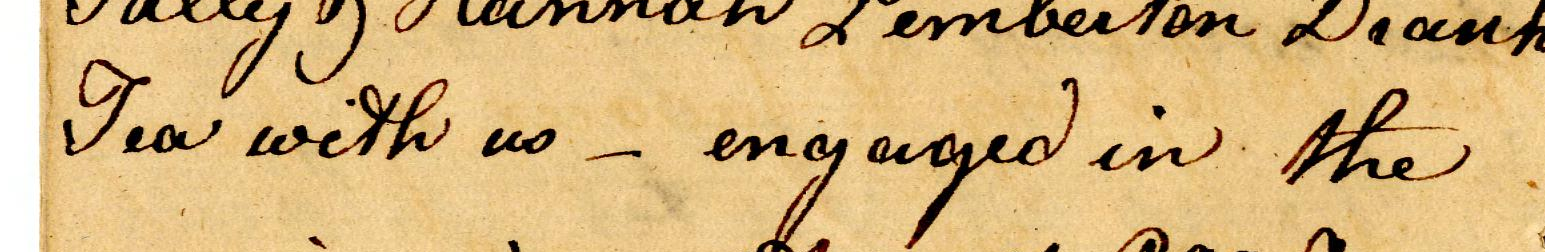Tea with us- engaged in the
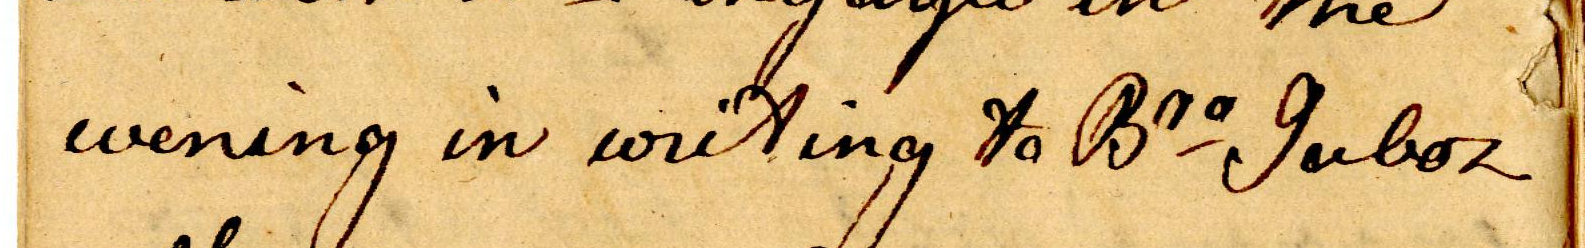evening in writing to B^ro Jabez
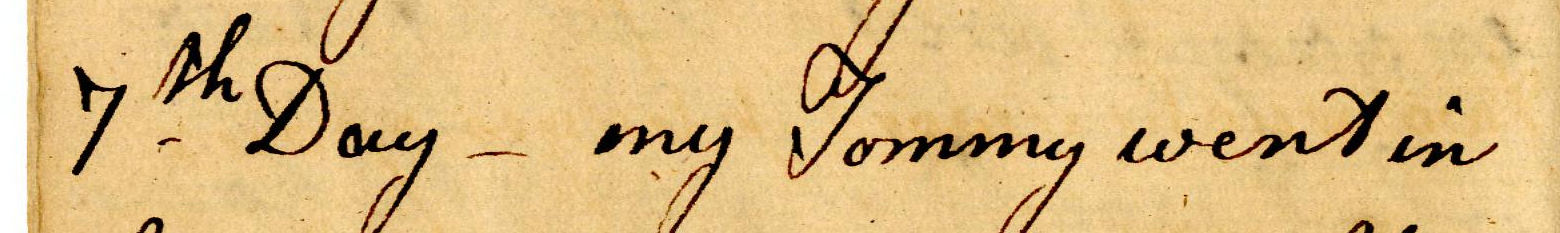7^th Day- my Tommy went in
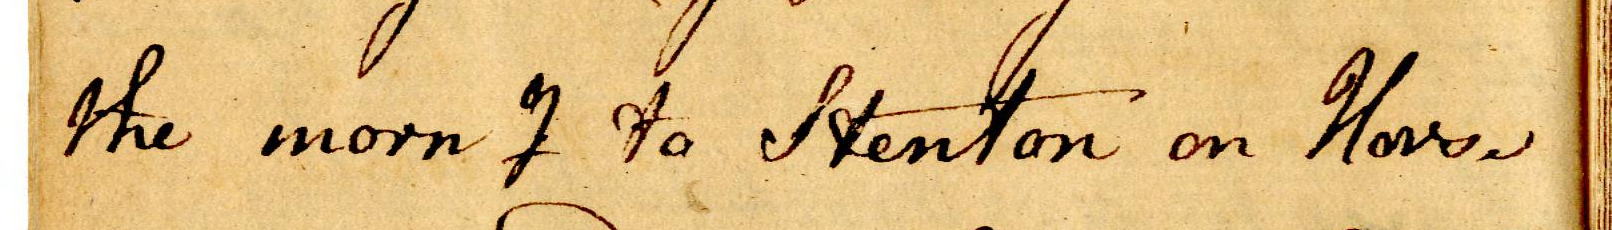the morn^g to Stenton on Horse
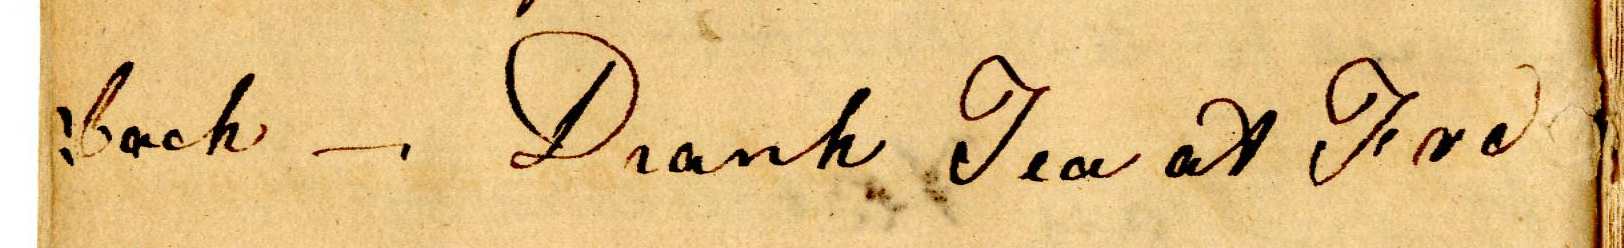-back- Drank Tea at Frd
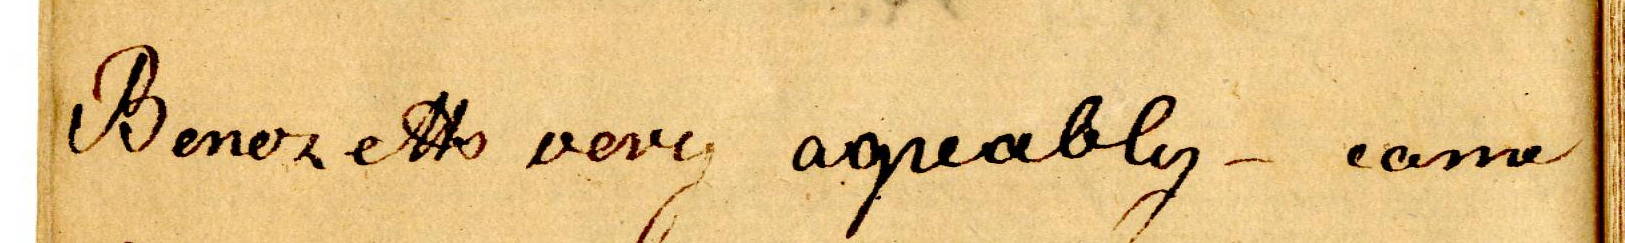Benezetts very agreably- came
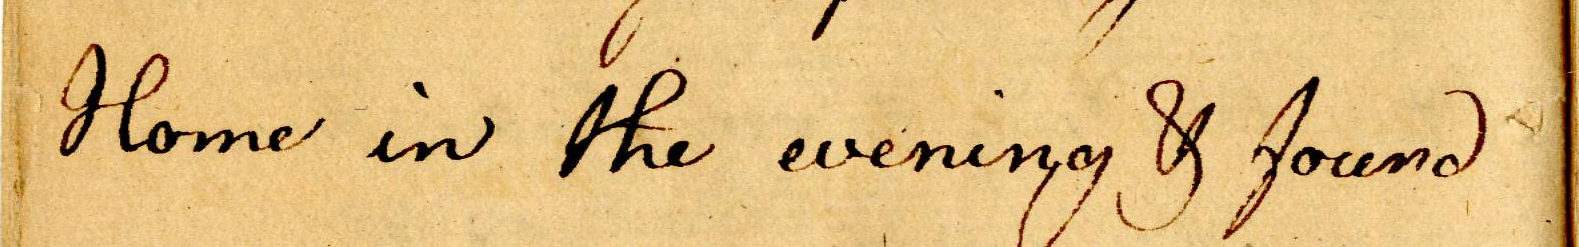Home in the evening & found
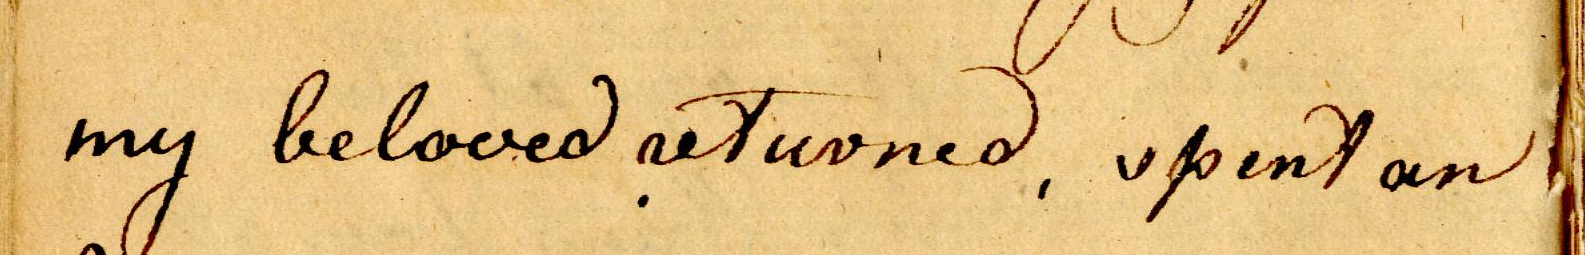my beloved returned, spent an
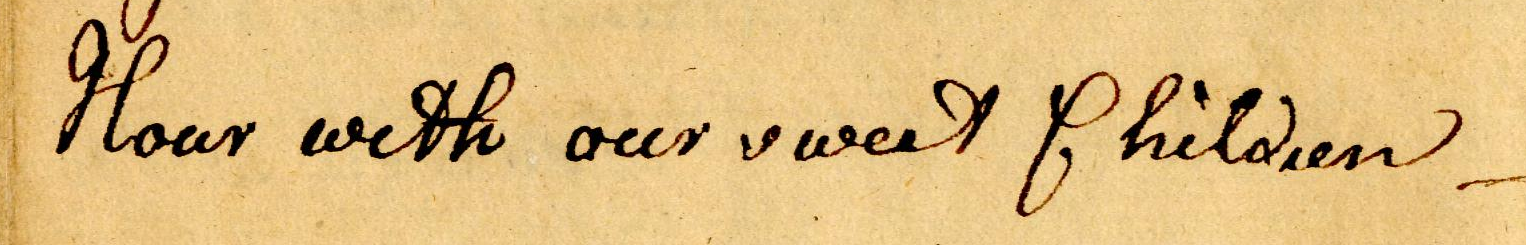Hour with our sweet Children-
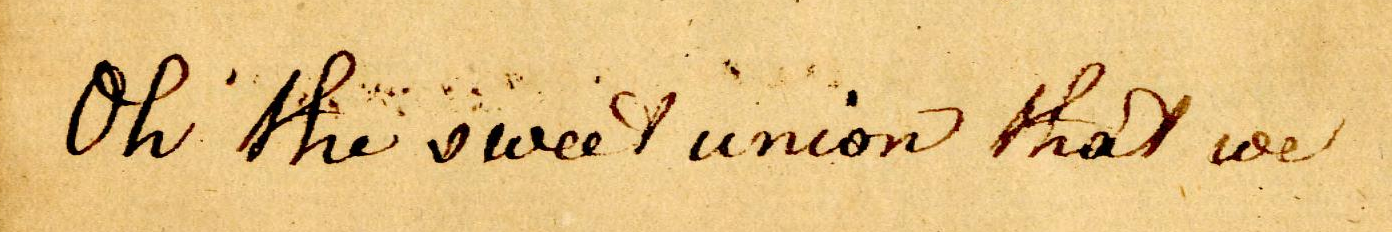oh the sweet union that we
